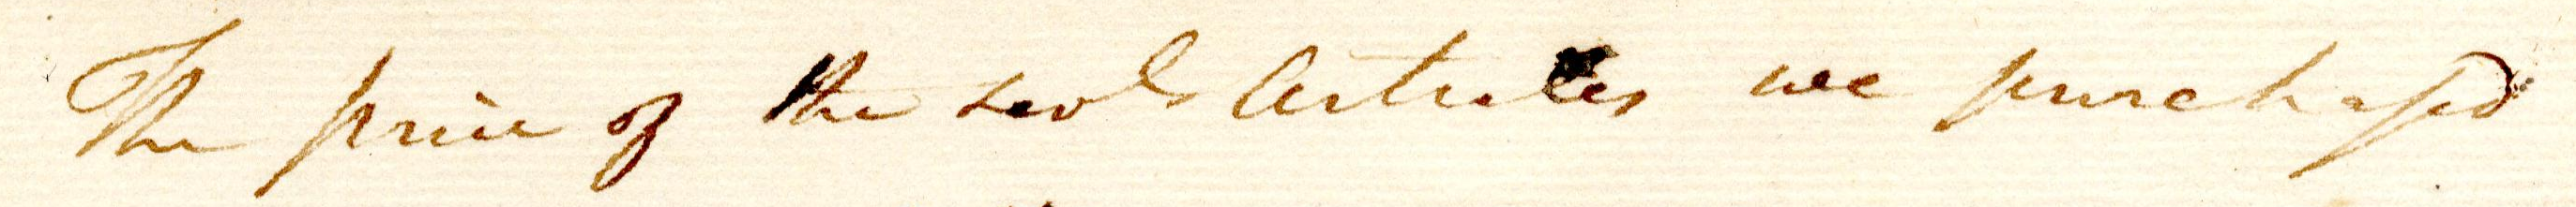The price of the sev^l Articles we purchased
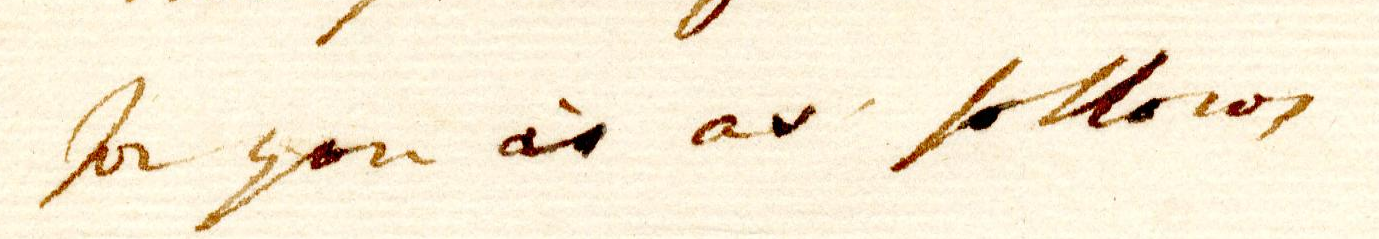for you is as follows
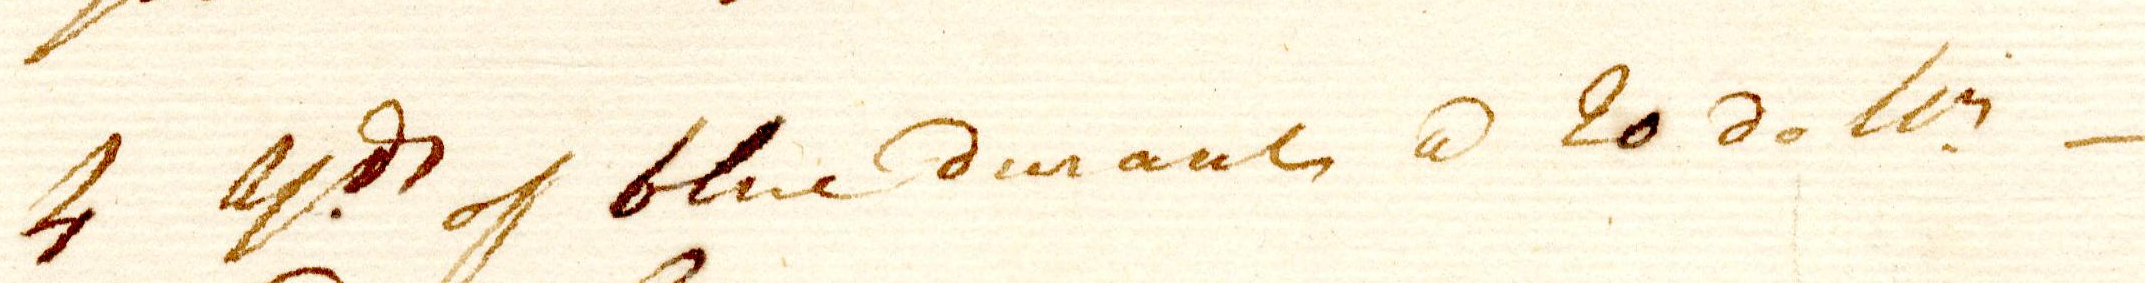4 Y^ds. of blue durant @ 20 doler
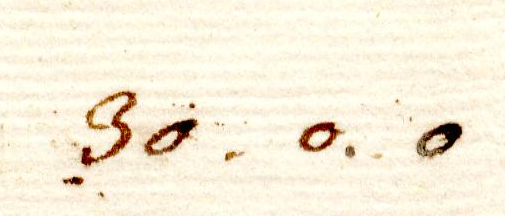30.0.0
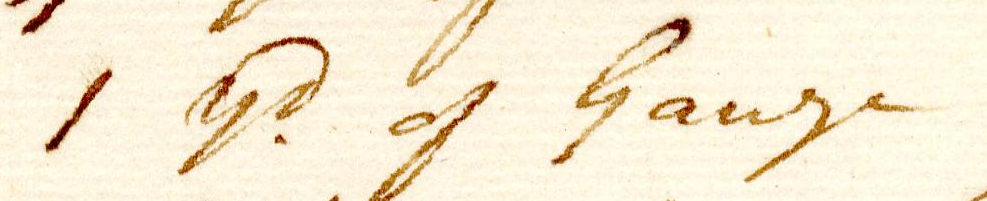1 y^d. of Gauze
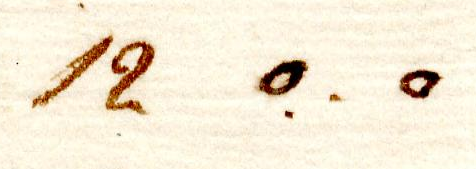12 0.0
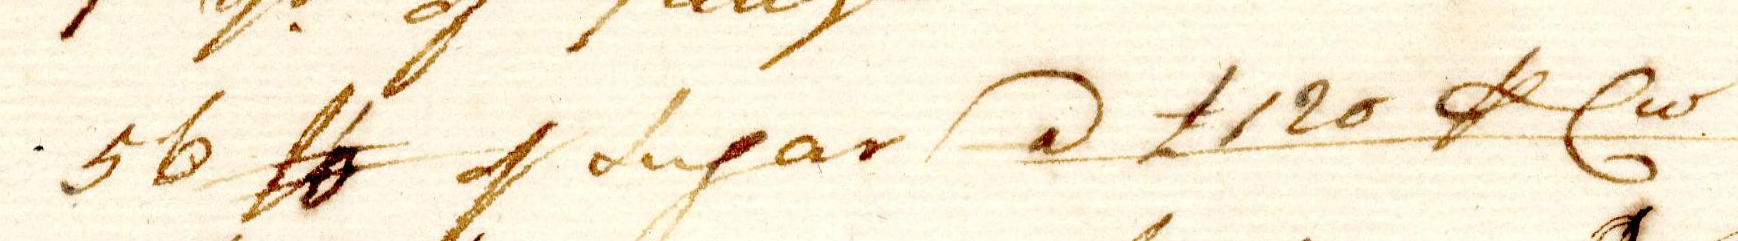56 lb of Sugar at £120 per Cw
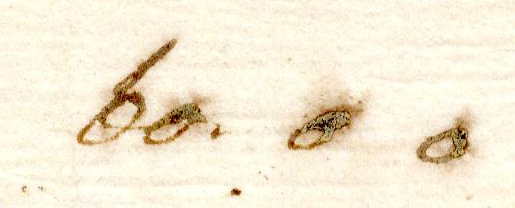60. 0. 0
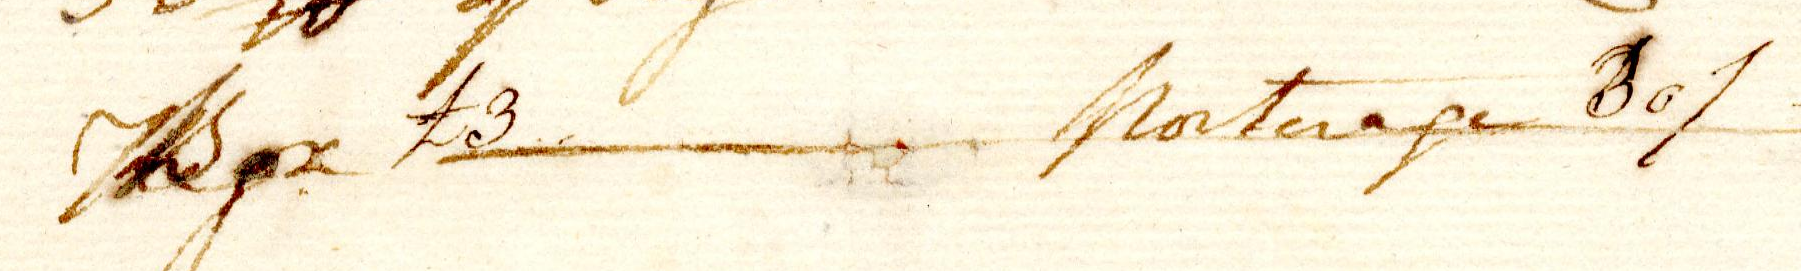Box £3 - porterage 30s
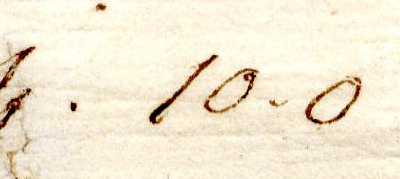4. 10.0
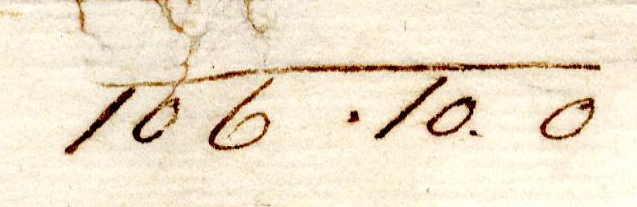106. 10. 0
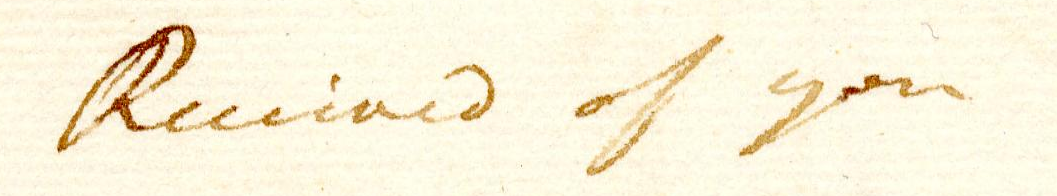Received of you
